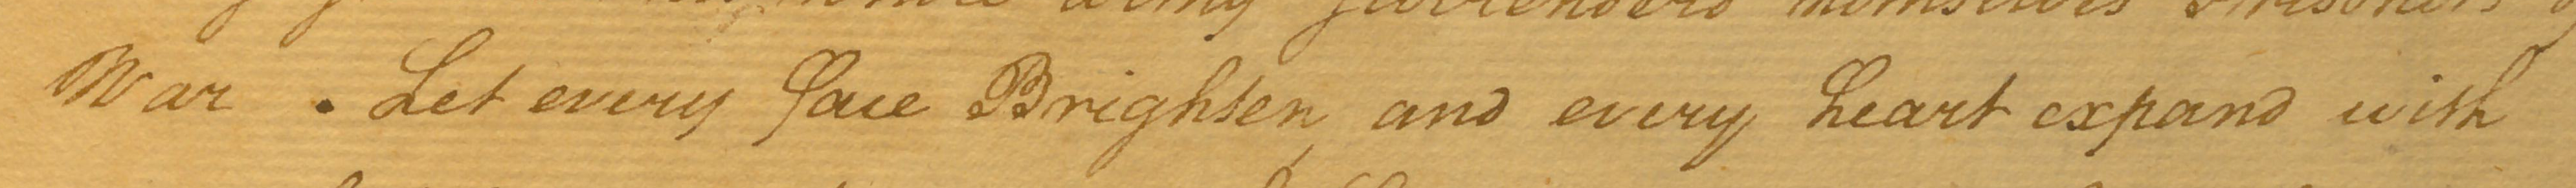War. Let every face Brighten and every heart expand with
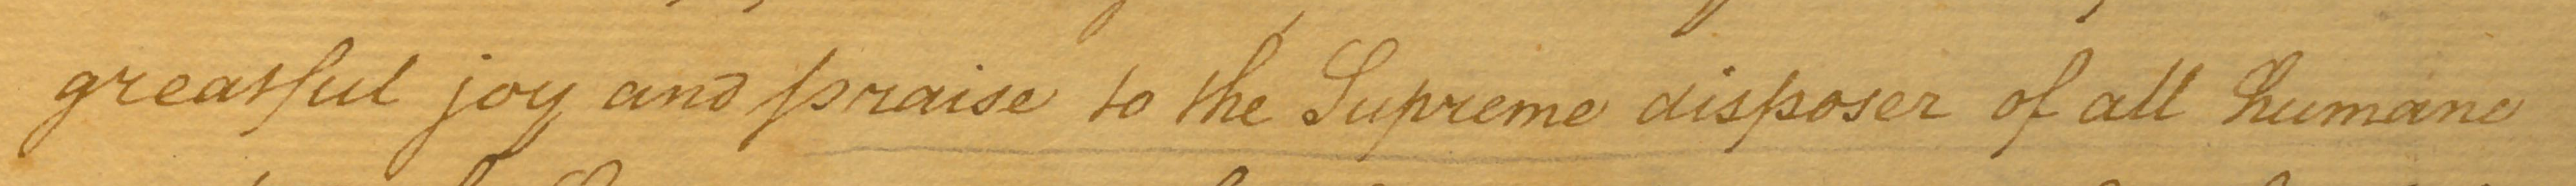greatful joy and praise to the Supreme disposer of all humane
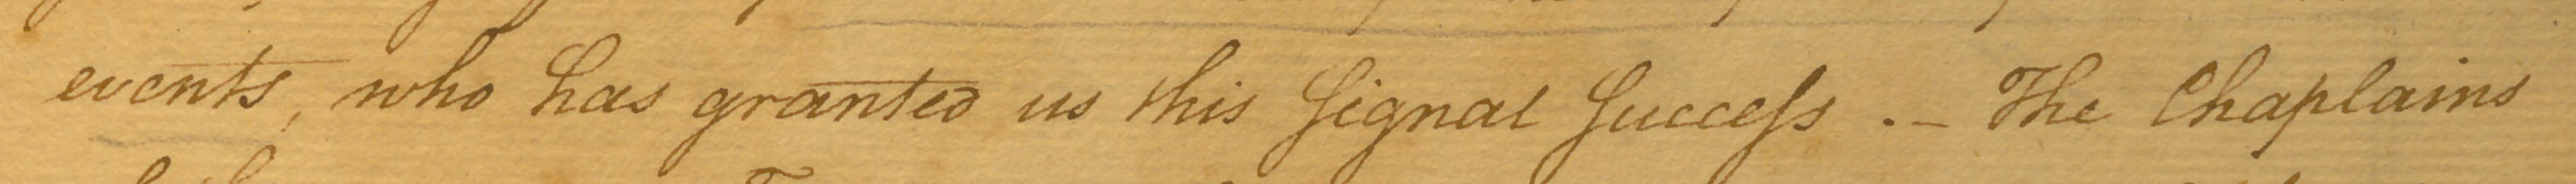events, who has granted us this signal success.- The Chaplains
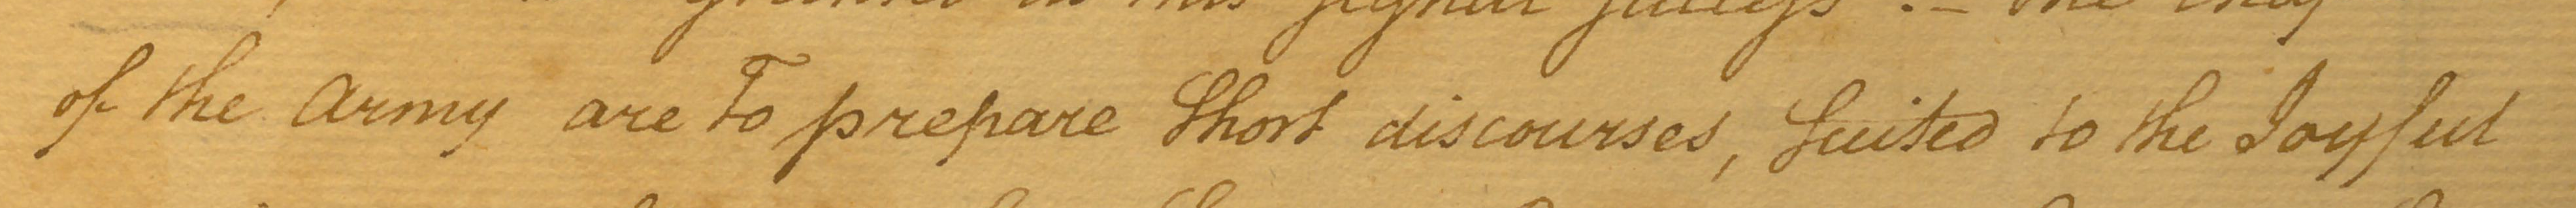of the Army are to prepare short discourses, suited to the Joyful
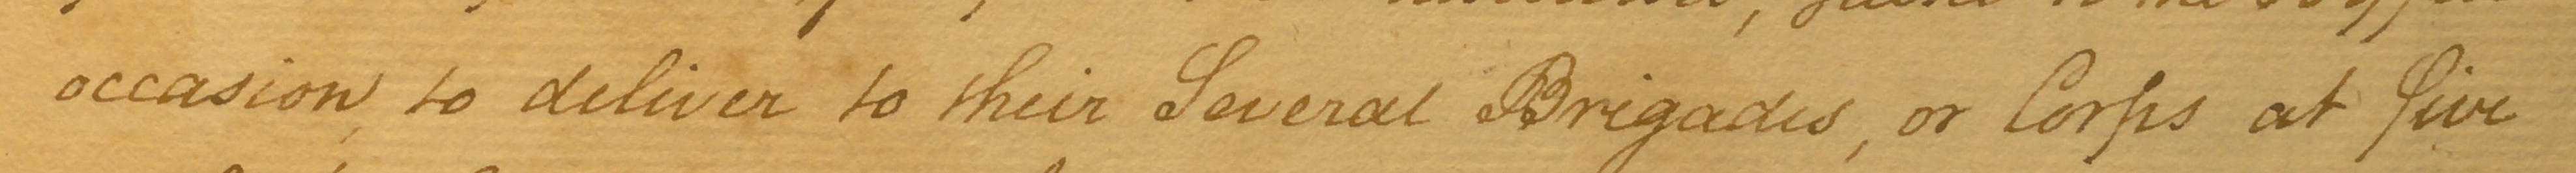occasion to deliver to their Several Brigades, or Corps at five
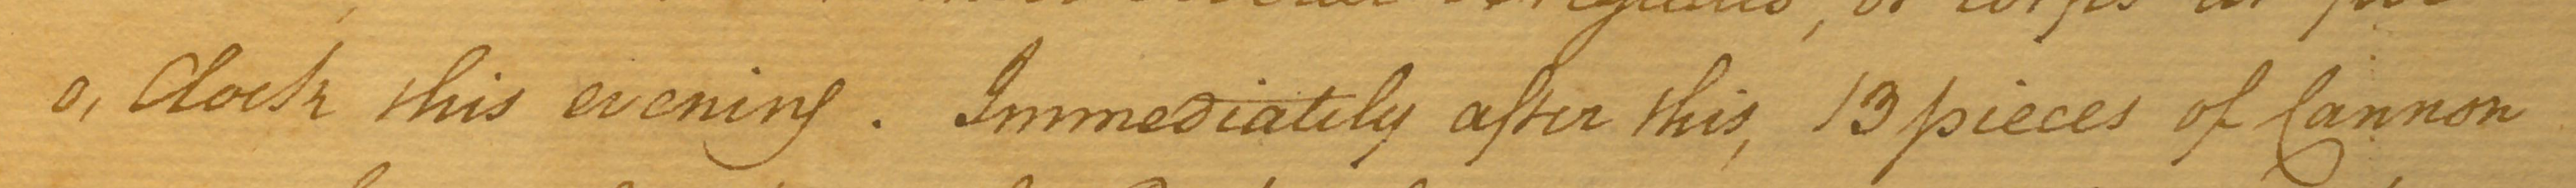o'Clock this evening. Immediately after this, 13 pieces of Cannon
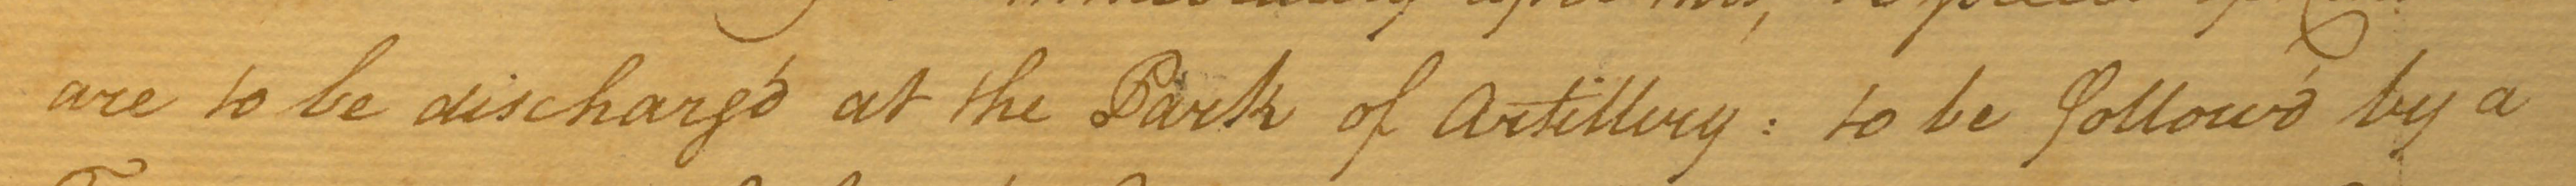are to be discharg'd at the Park of Artillery: to be follow'd by a
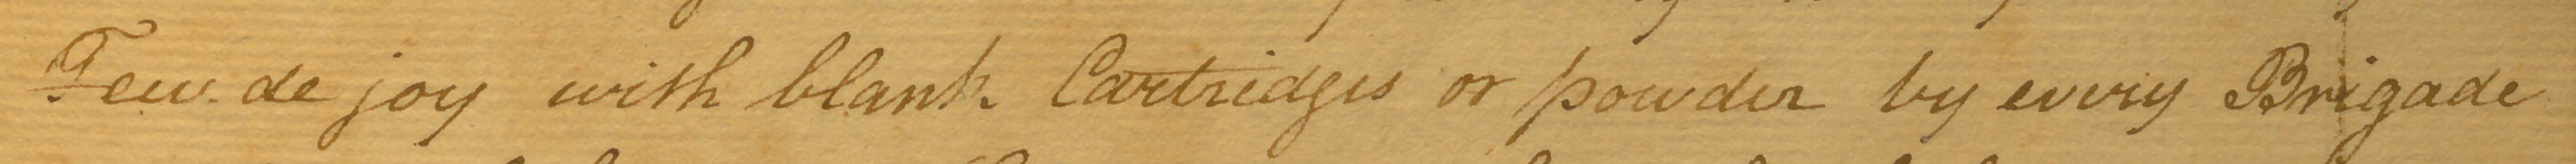Feu de joy with blank Cartridges or powder by every Brigade
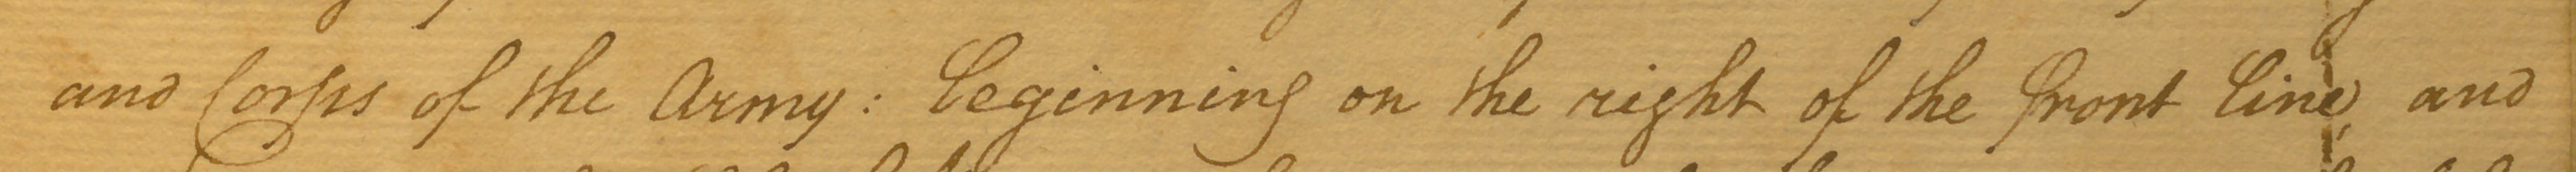and Corps of the Army: Beginning on the right of the front line and
